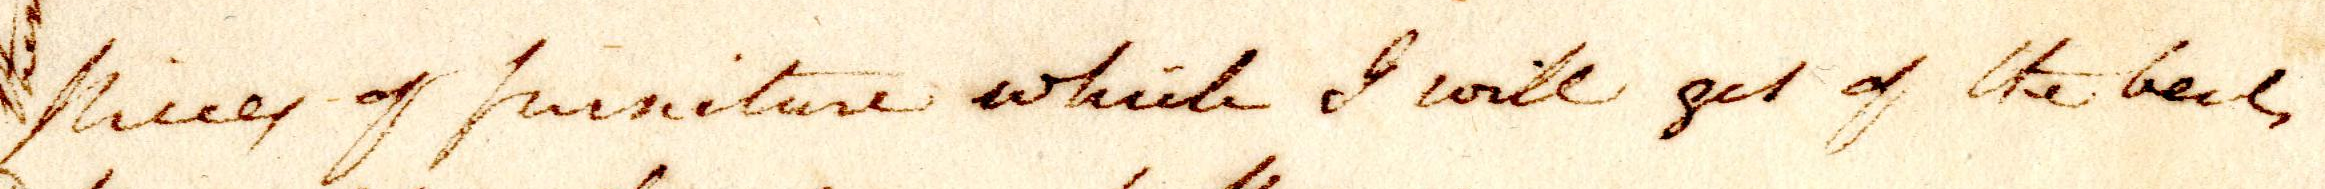Pieces of furniture which I will get of the best
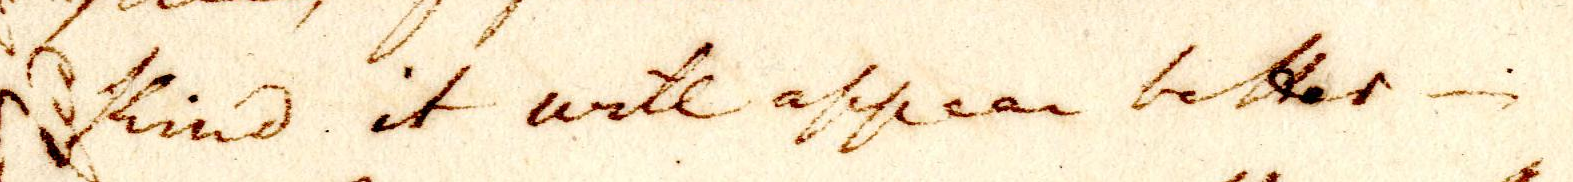Kind it will appear better.
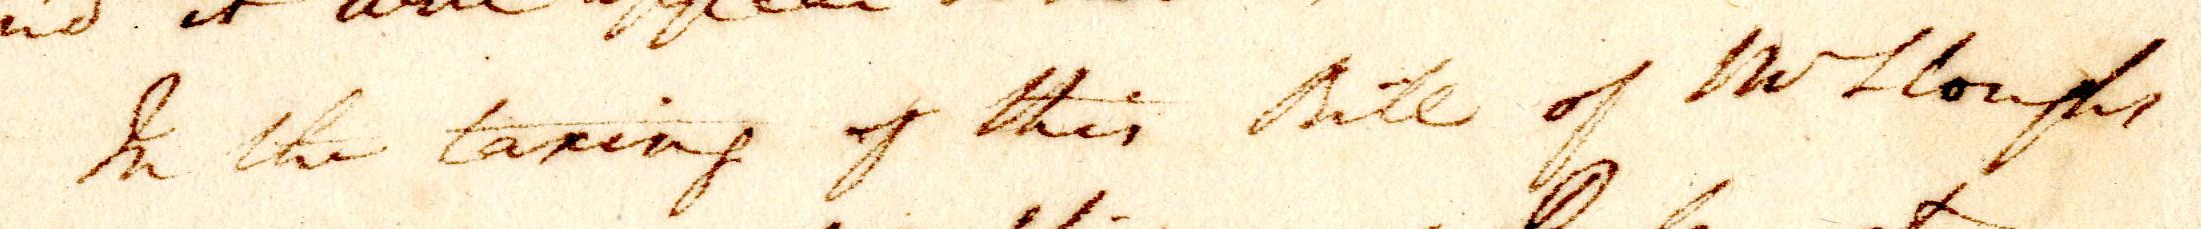In the taxing of this Bill of M^r Sloughs
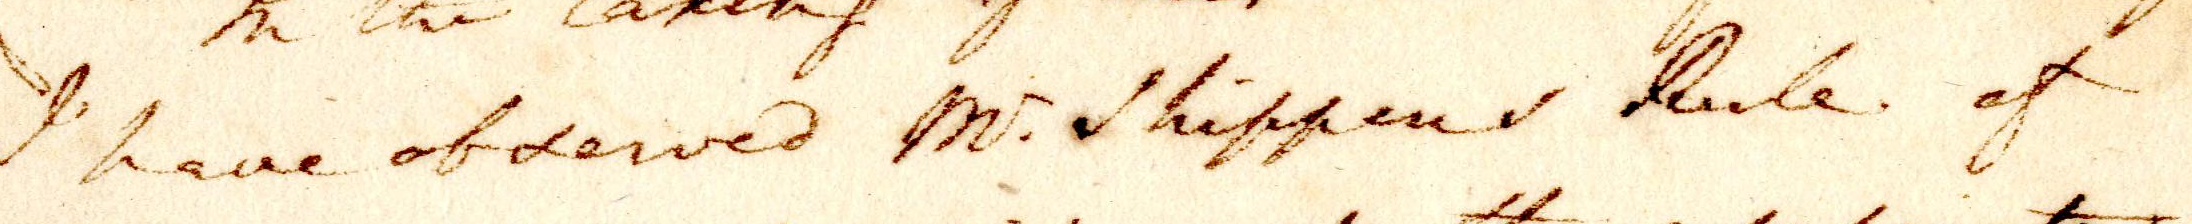I have observed M^r. Shippens Rule of
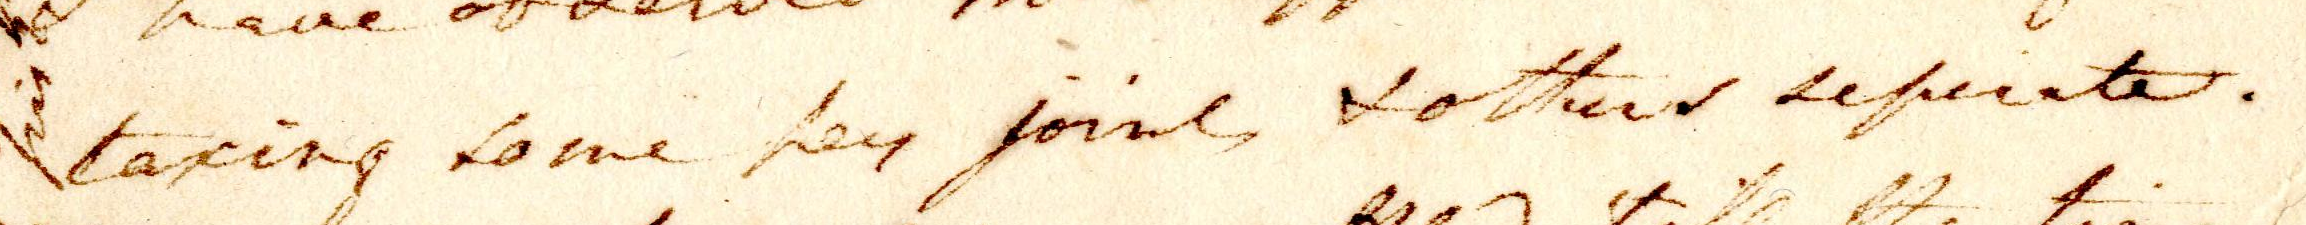taxing some per joint & others seperate.
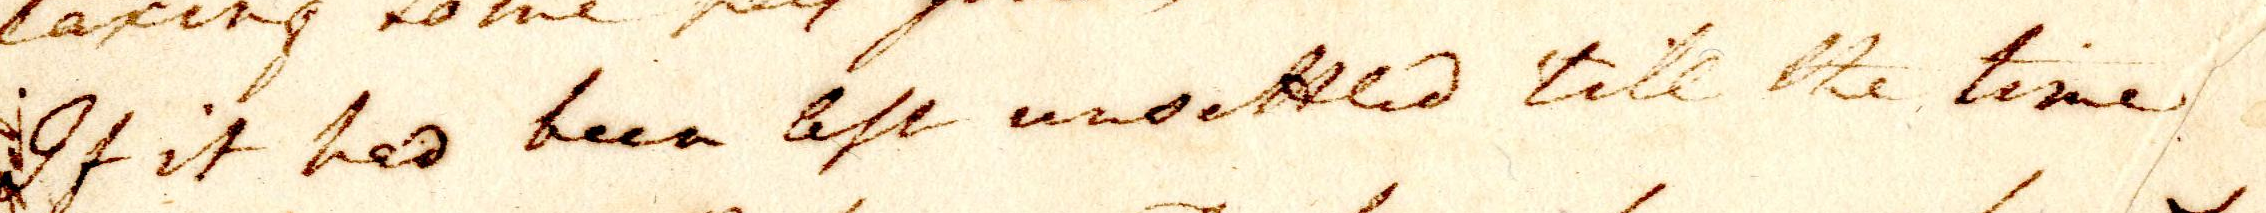If it had been left unsettled till the time
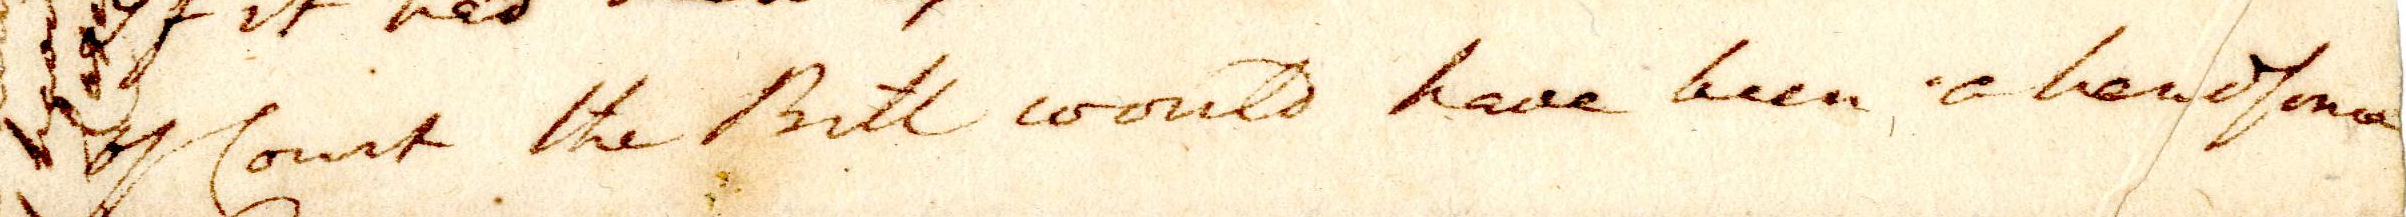of Court the Bill would have been a head fence
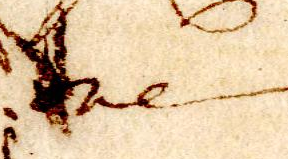one
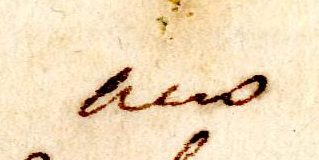new
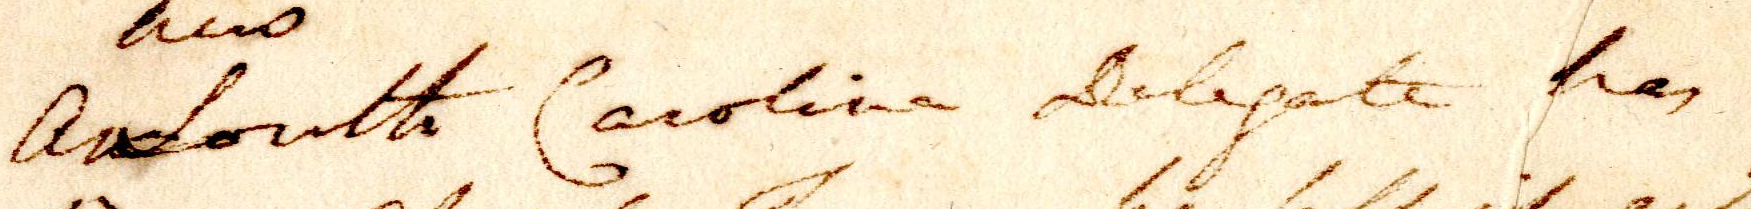A ^ South Carolina Delegate has
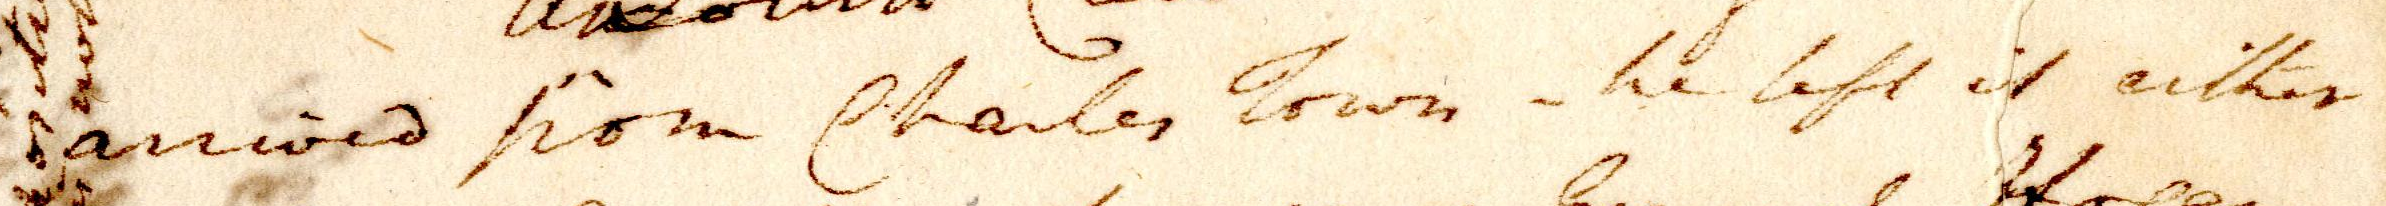arrived from Charles Town. he left it either
